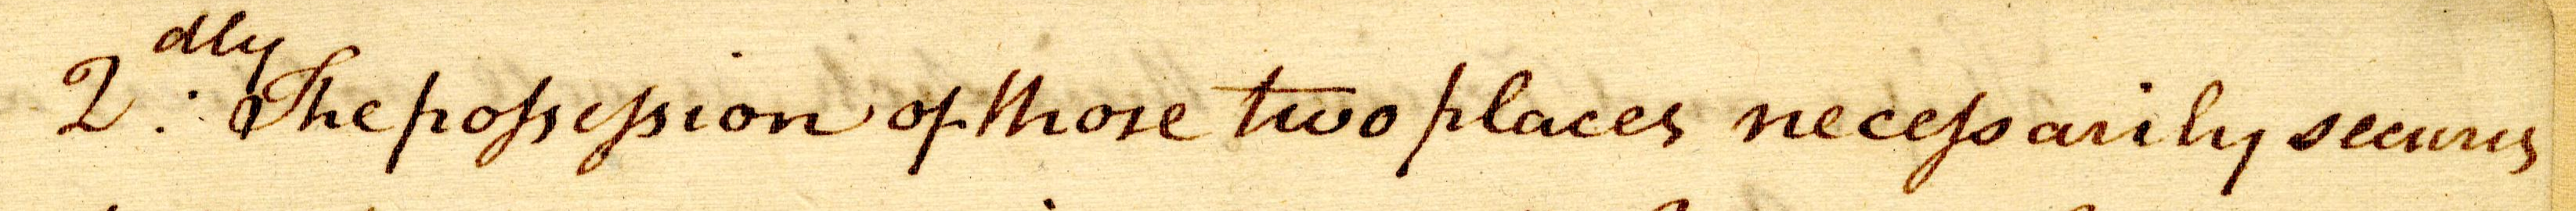2^dly: The possession of those two places necessarily secures
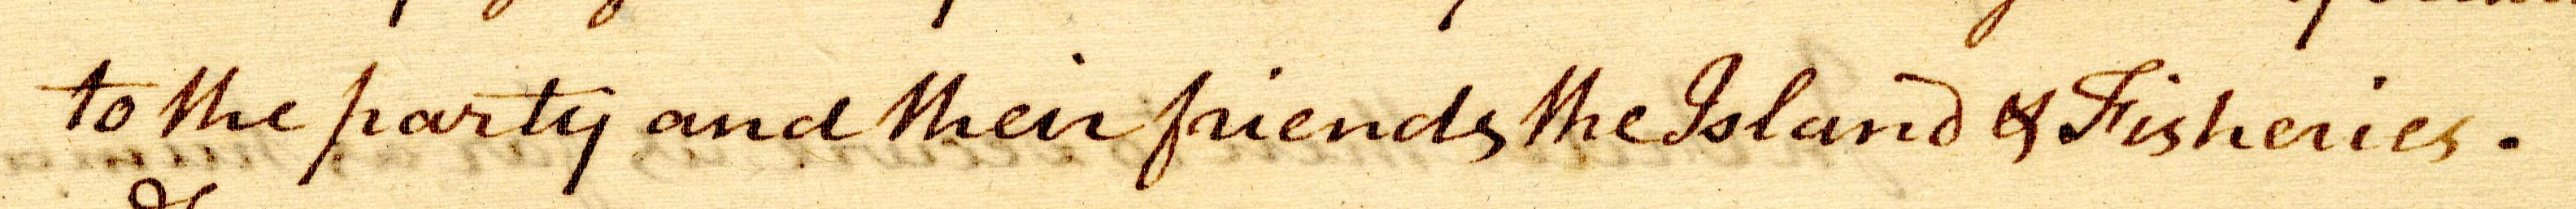to the party and their friends the Island & Fisheries.
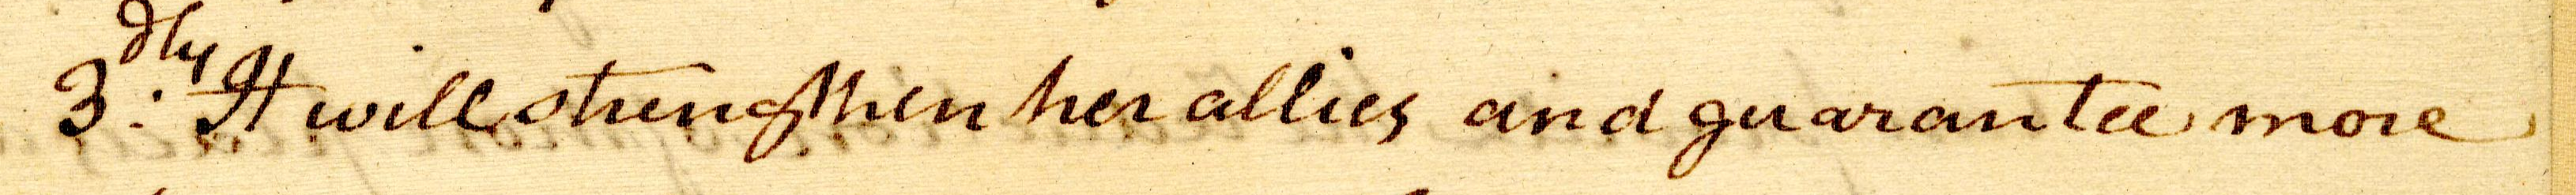3^dly: It will strengthen her allies and guarantee more
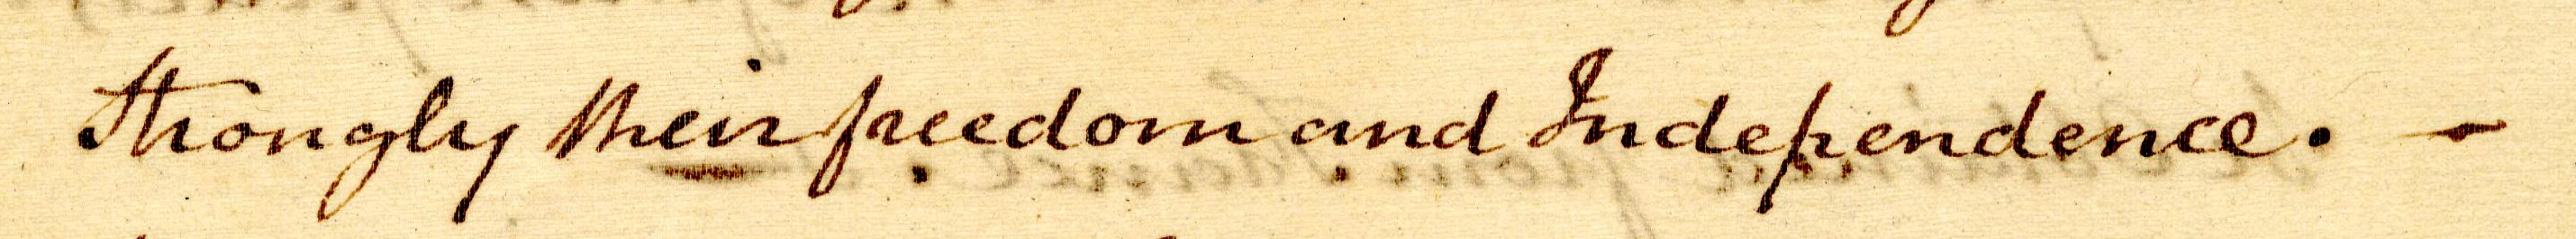Strongly their freedom and Independence.-
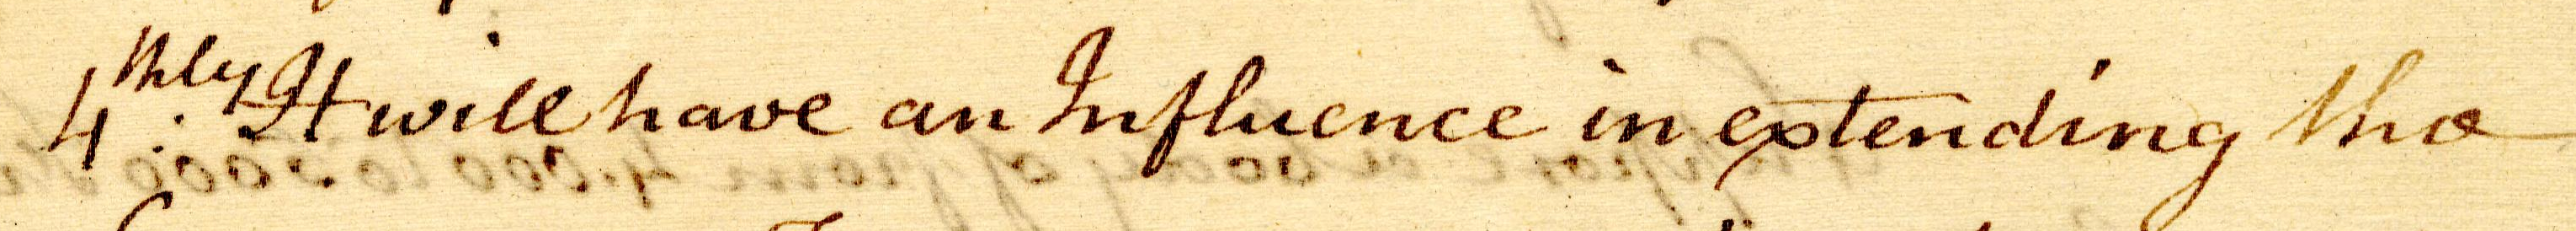4^thly: It will have an Influence in extending the
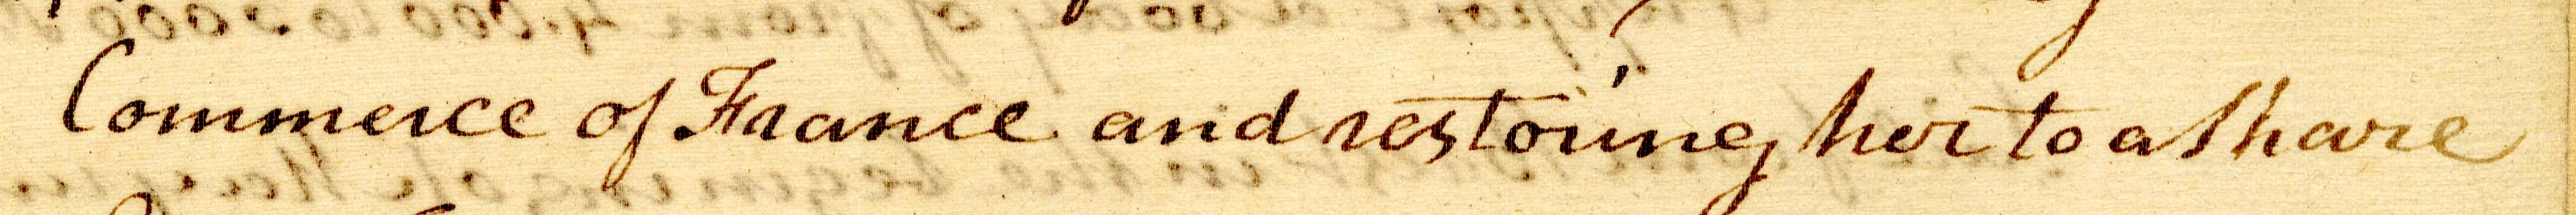Commerce of France and restoring her to a share
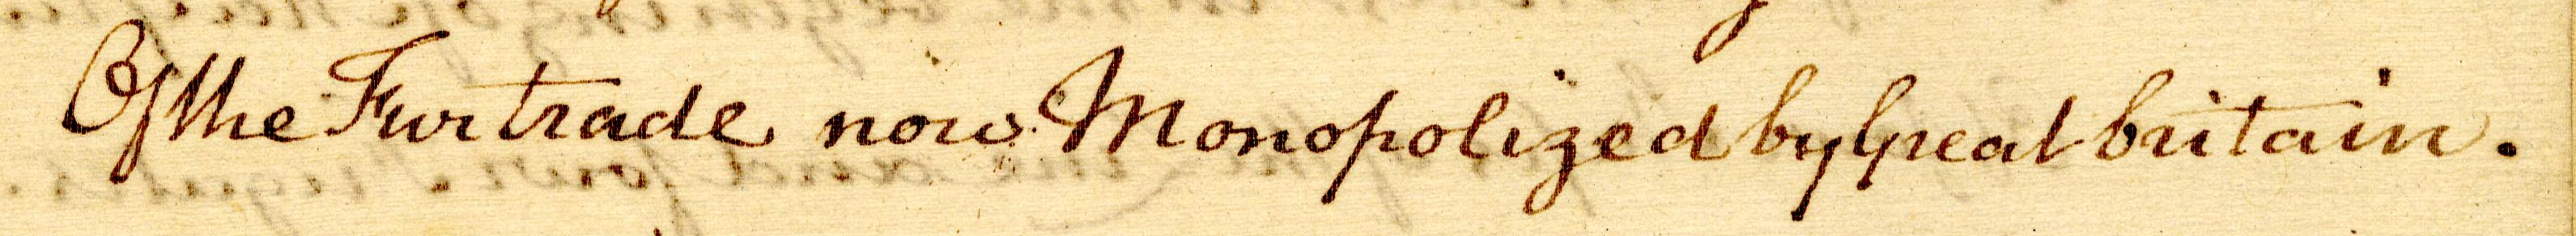Of the Fur trade now Monopolized by Great britain.
